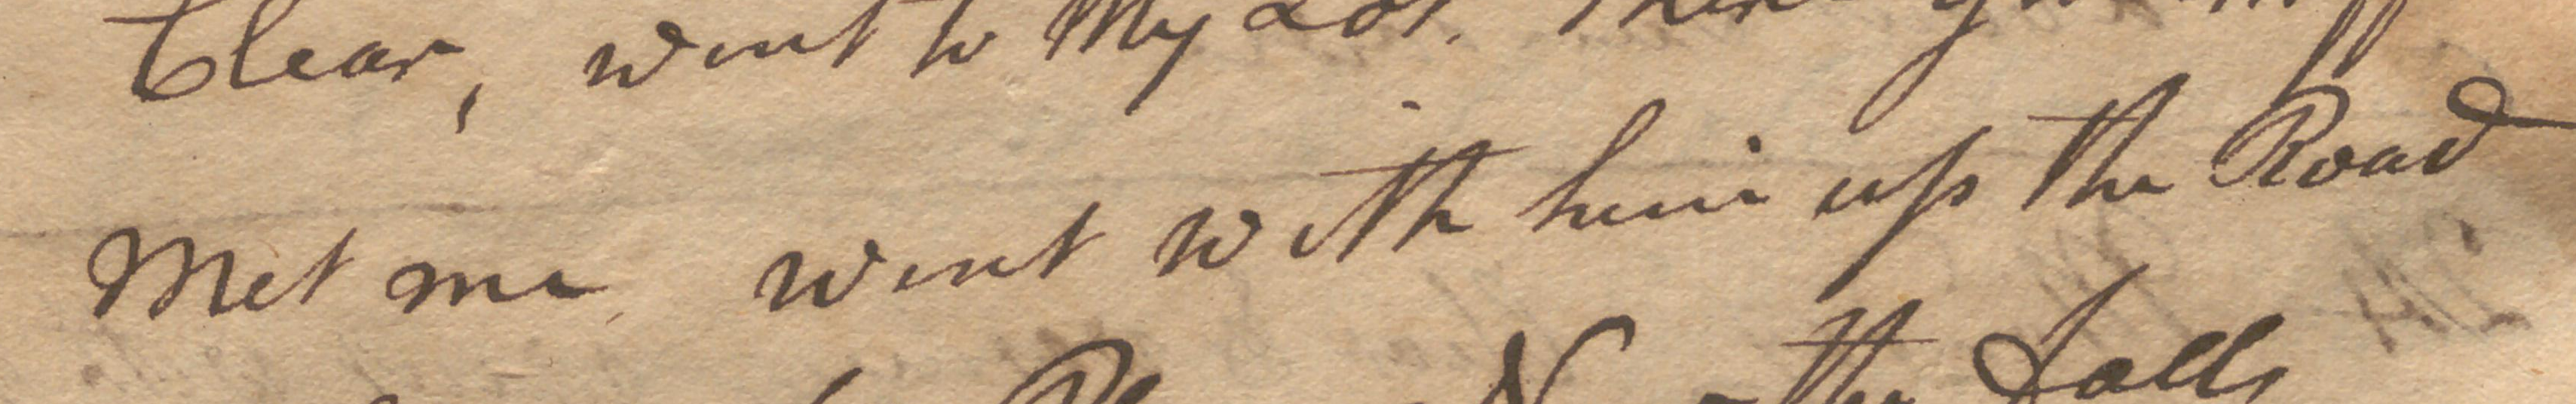Met me went with him up the Road
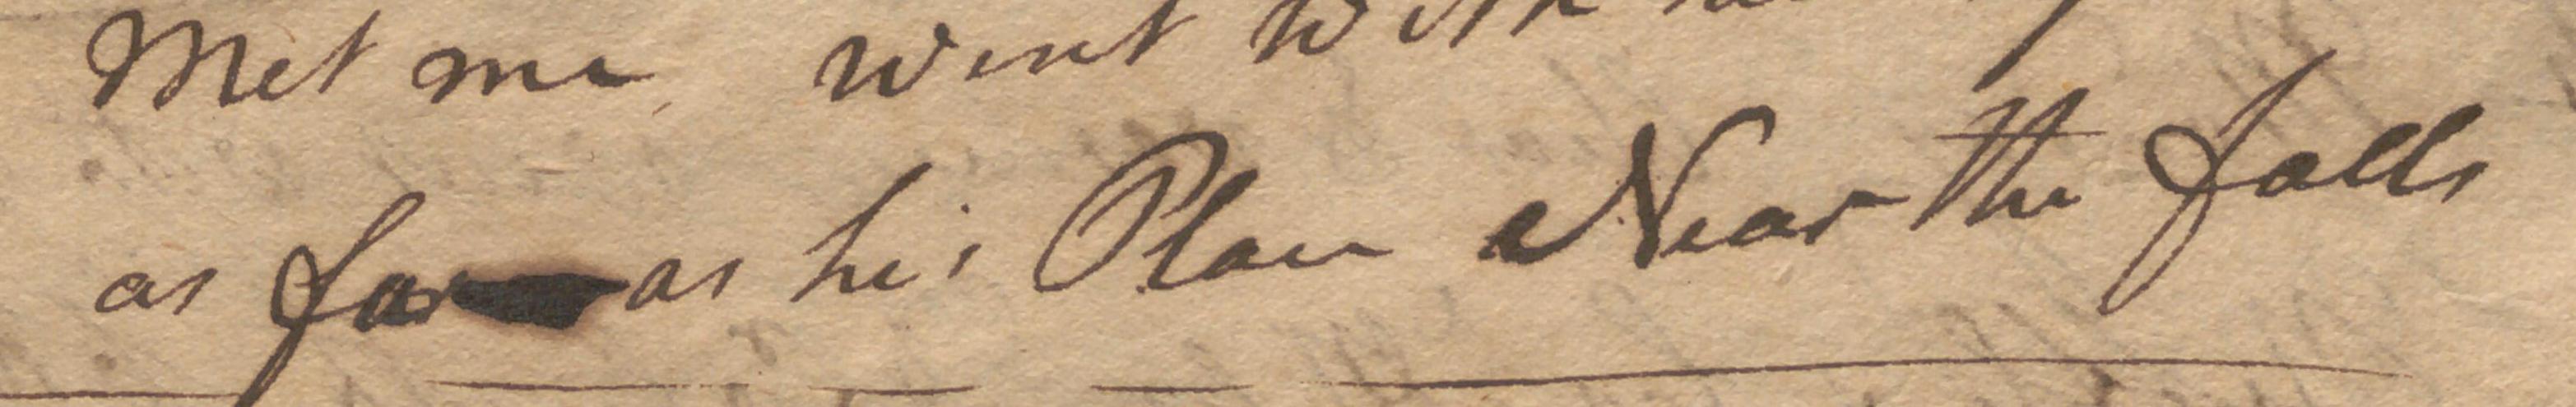as far as his Place Near the falls
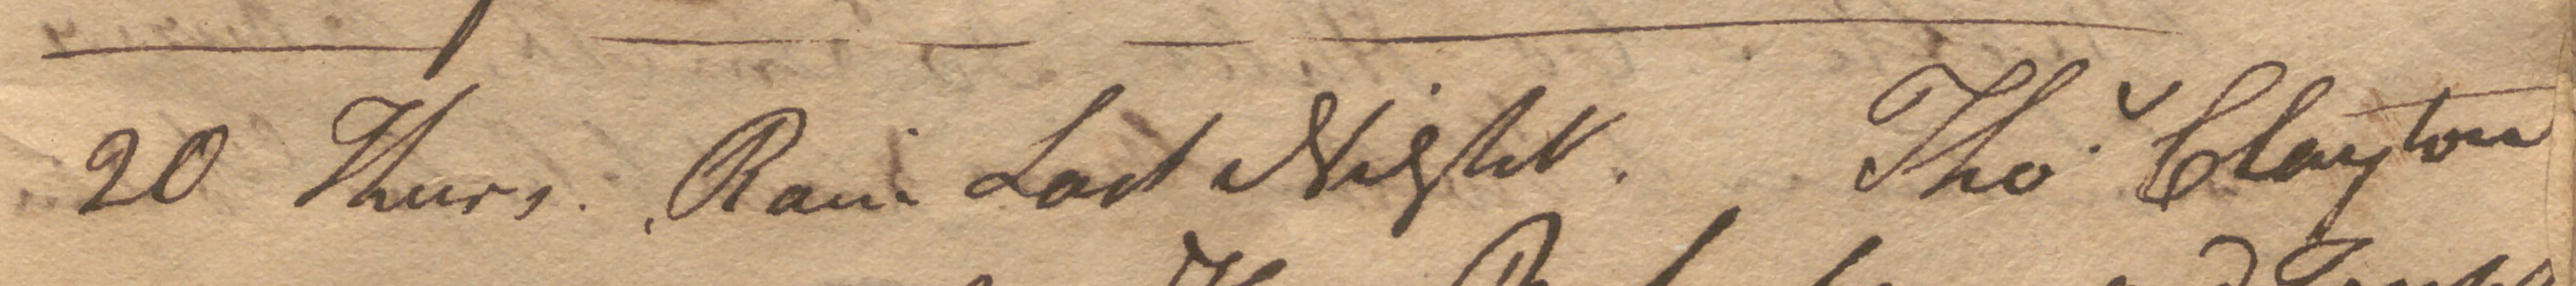20 Thurs. Raw Last Night. Tho^s. Clayton
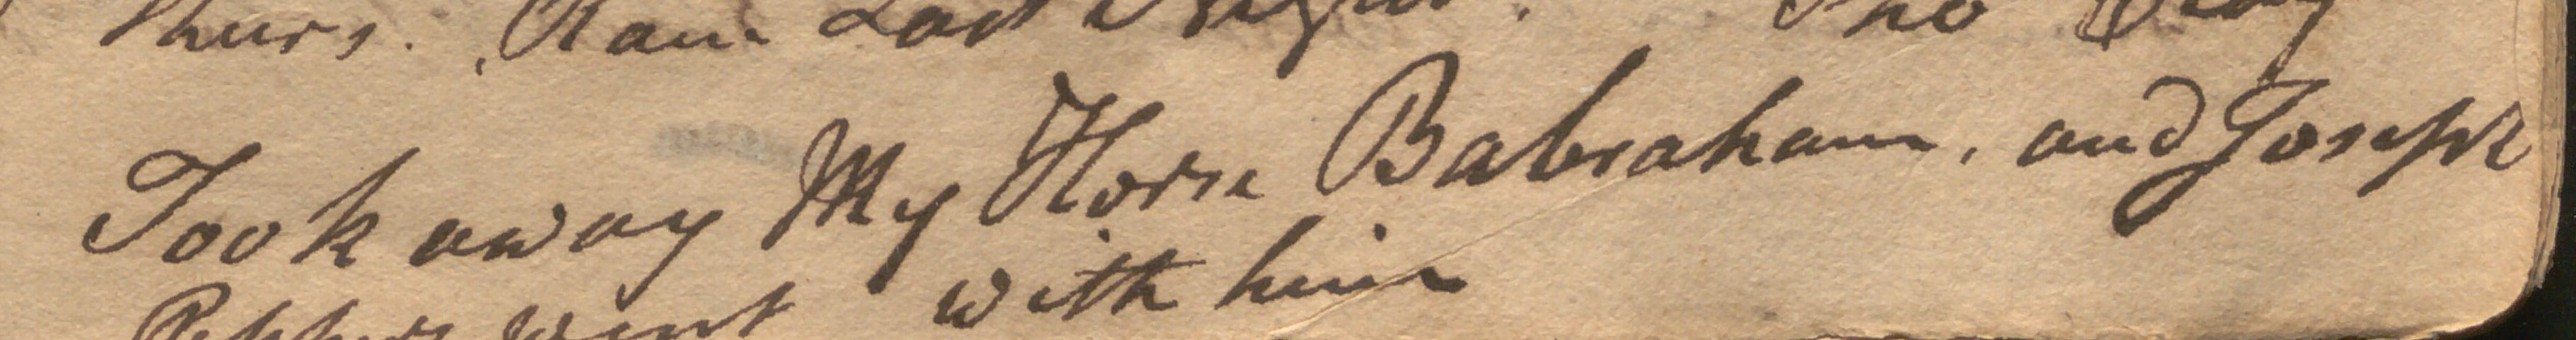Took away My Horse Babraham, and Joseph
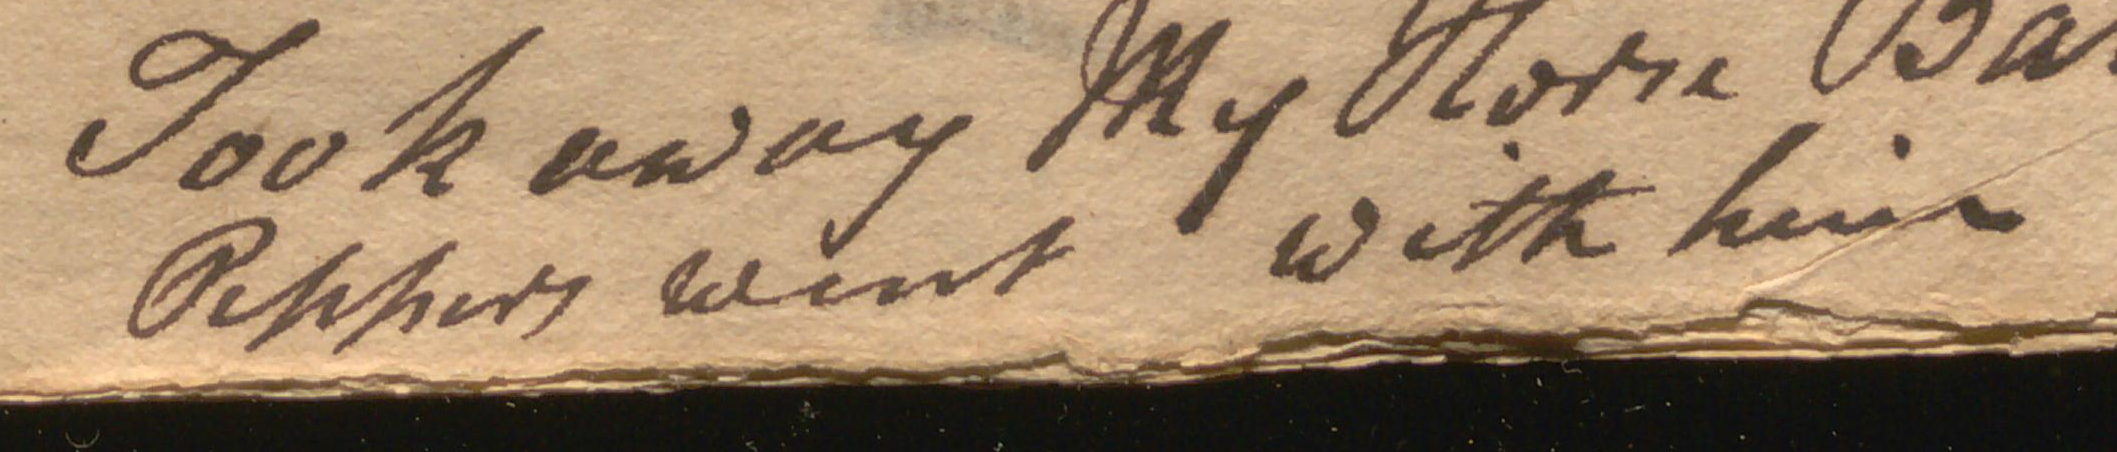Peppers went with him
